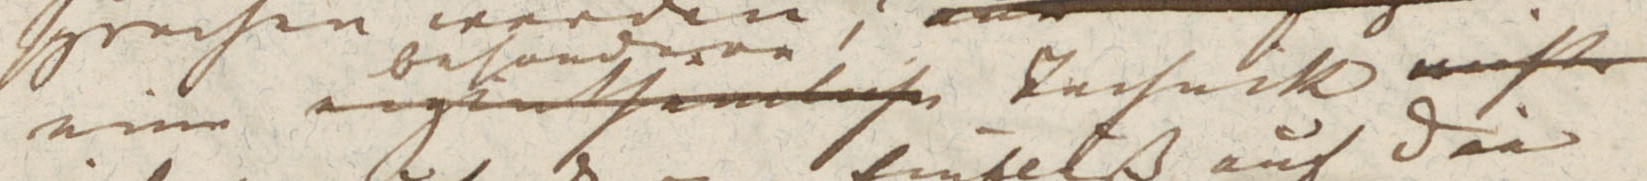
eine eigenthümliche besondere Technik nicht
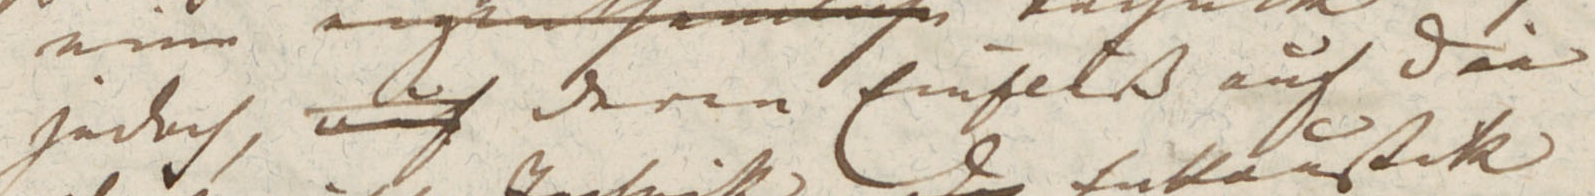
jedoch, auf deren Einfluss auf die
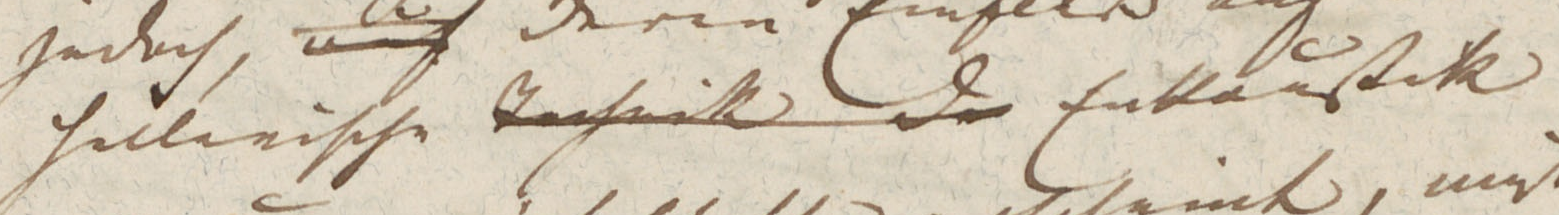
Hellenische Technik d Enkaustik
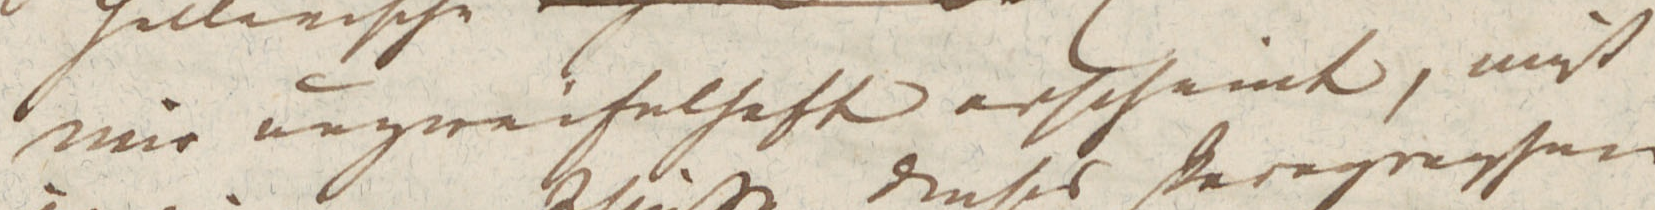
mir unzweifelhaft erscheint, muss
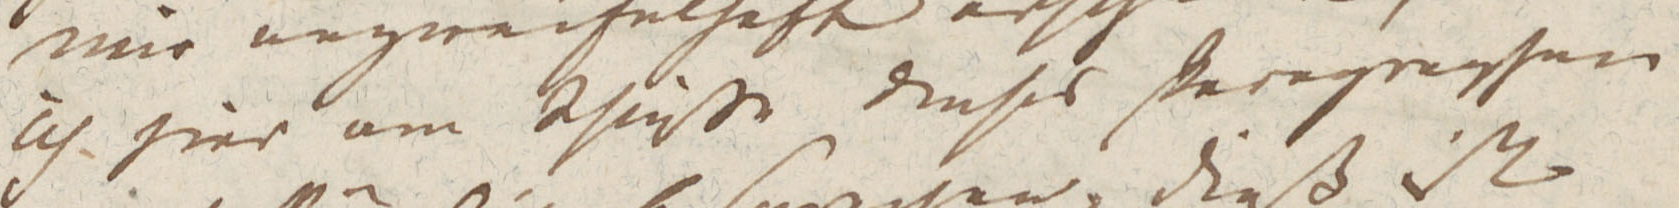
ich hier am Schlusse dieses Paragraphen
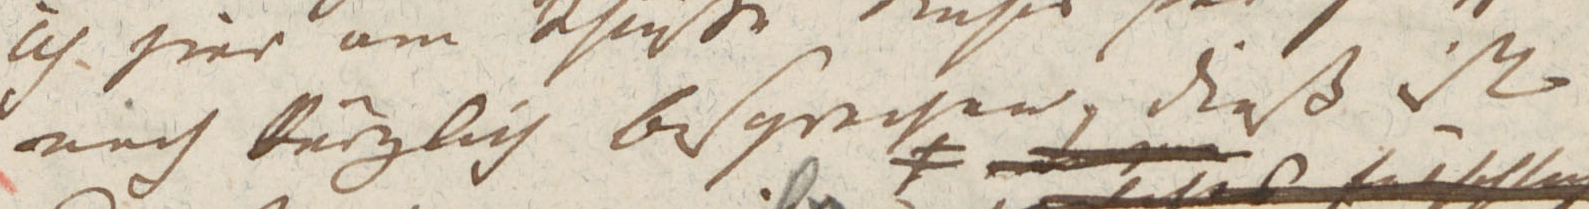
%noch kürzlich besprechen, diess ist
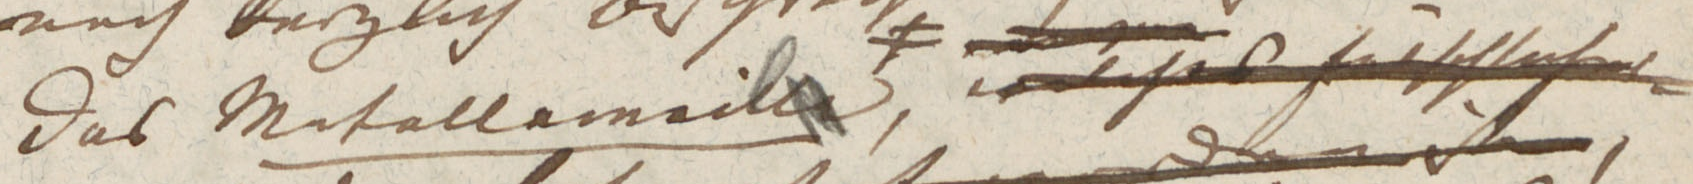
das Metallemaillle %, welches fälschlicher-
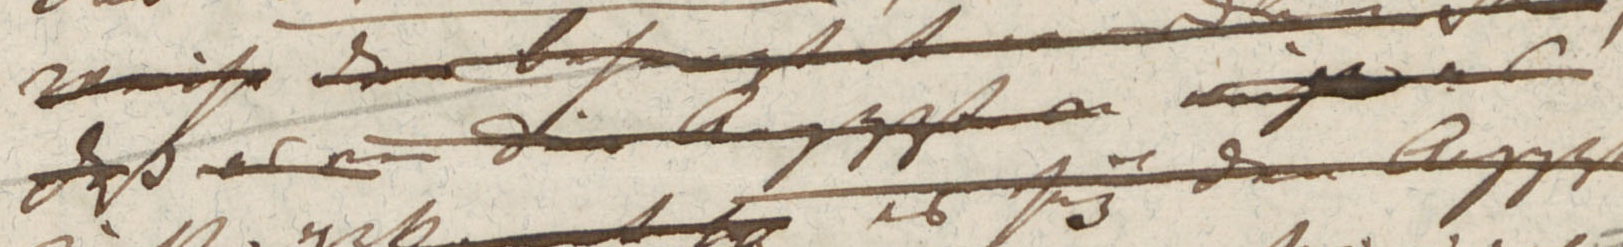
dass es von den Aegyptern nicht es
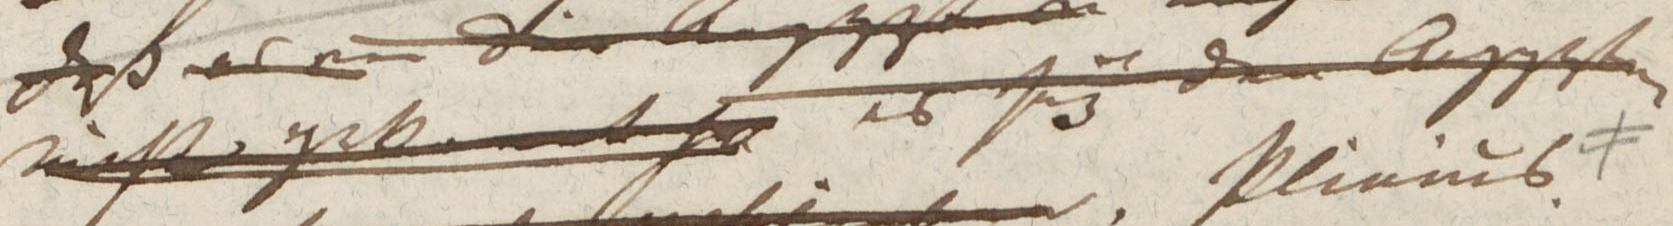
nicht gekannt hat es sey den Aegyptern
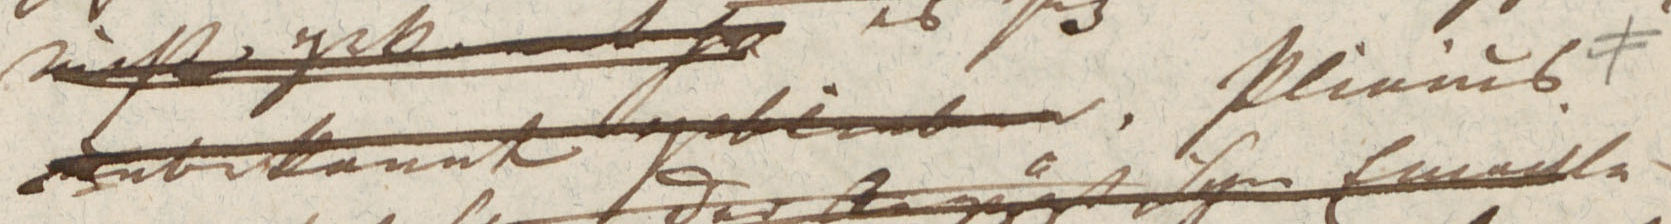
unbekannt geblieben. Plinius %
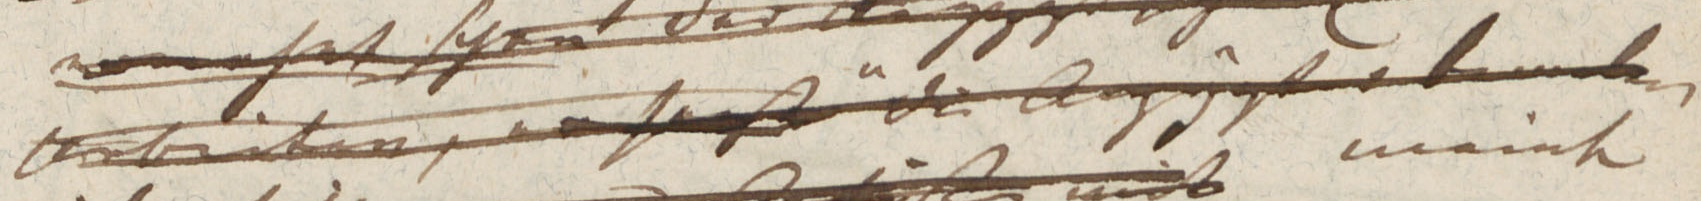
arbeiten, er sagt die Aegypter bemalen
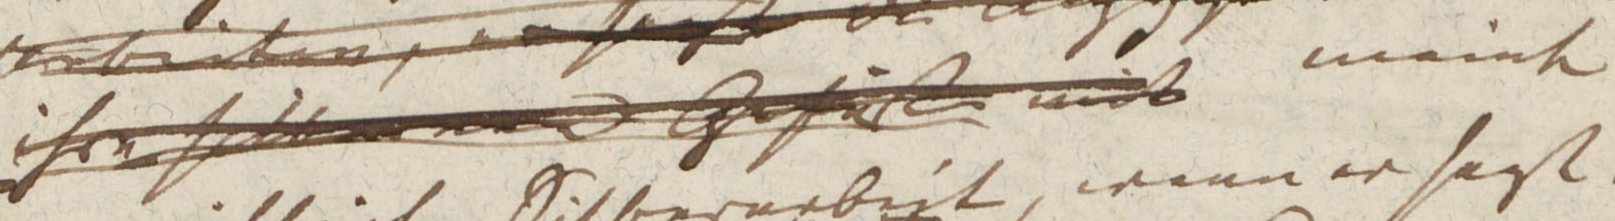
ihre silbernen Gefässe mit meint
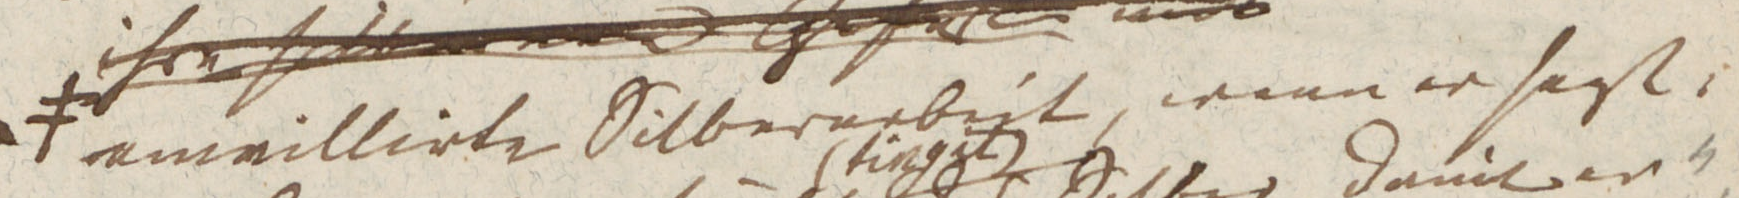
% emaillirte Silberarbeit, wenn er sagt;
